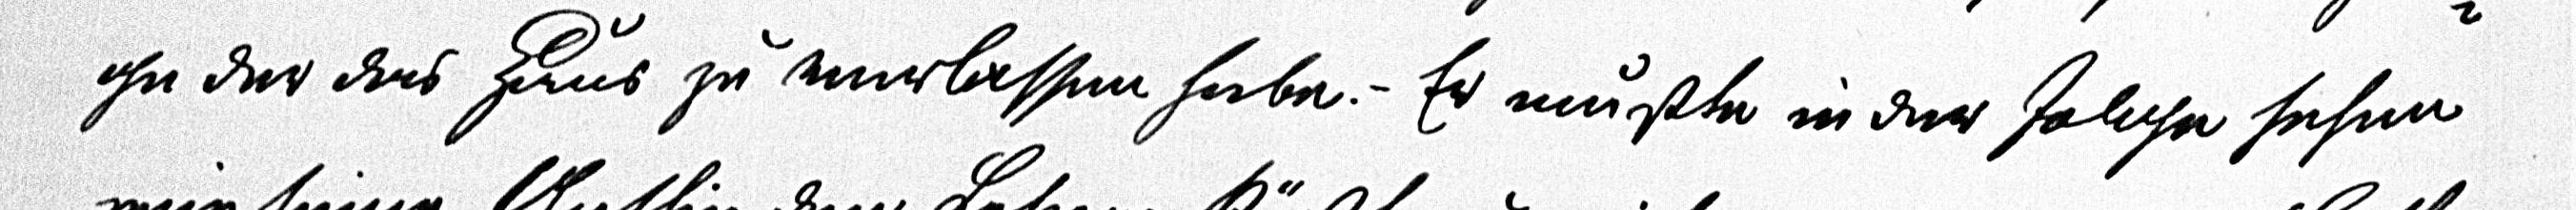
ge der das Haus zu verlassen habe. - Er mußte in der Folge sehen
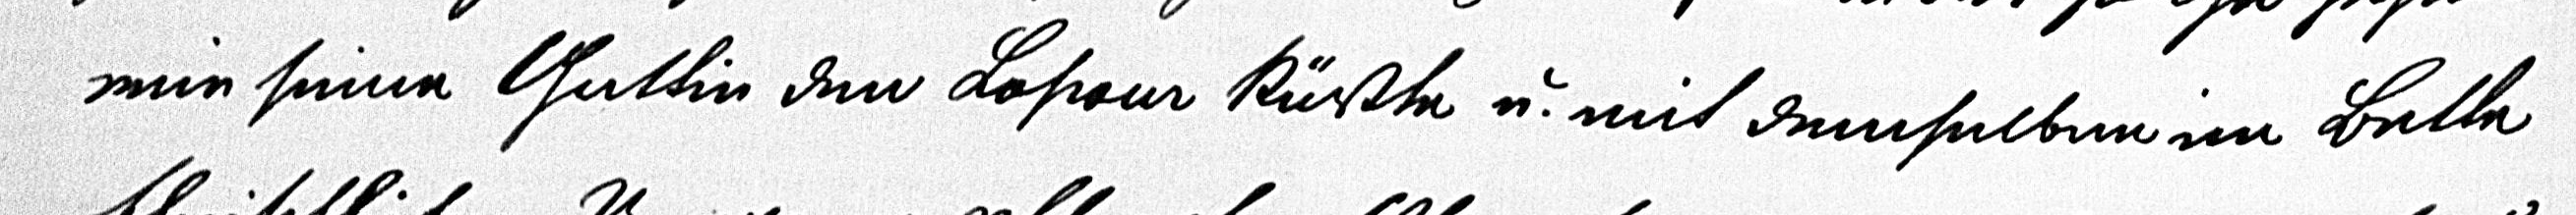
eine seine Gattin den Lopour Kürste u. mit demselben im Bette
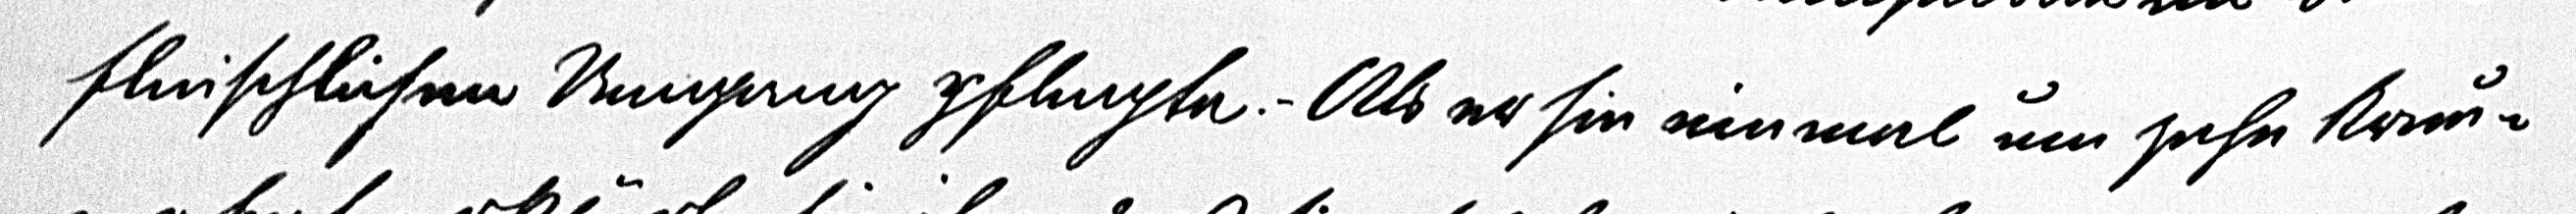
fleischlichen Nergang pflegte. - Als er sie einmal um sehe Kreu¬
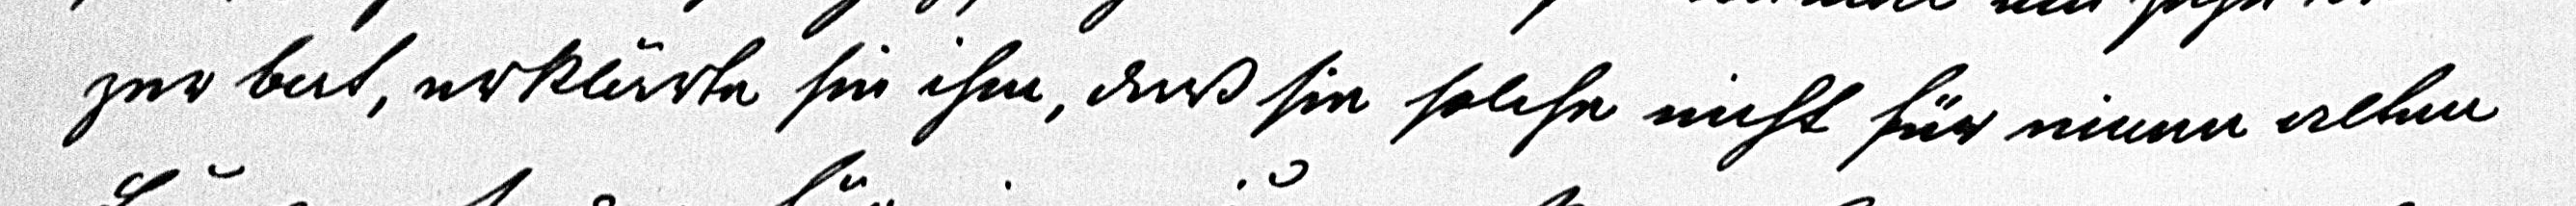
zer bat, erklärte sie ihm, daß sie solche nicht für einen alten
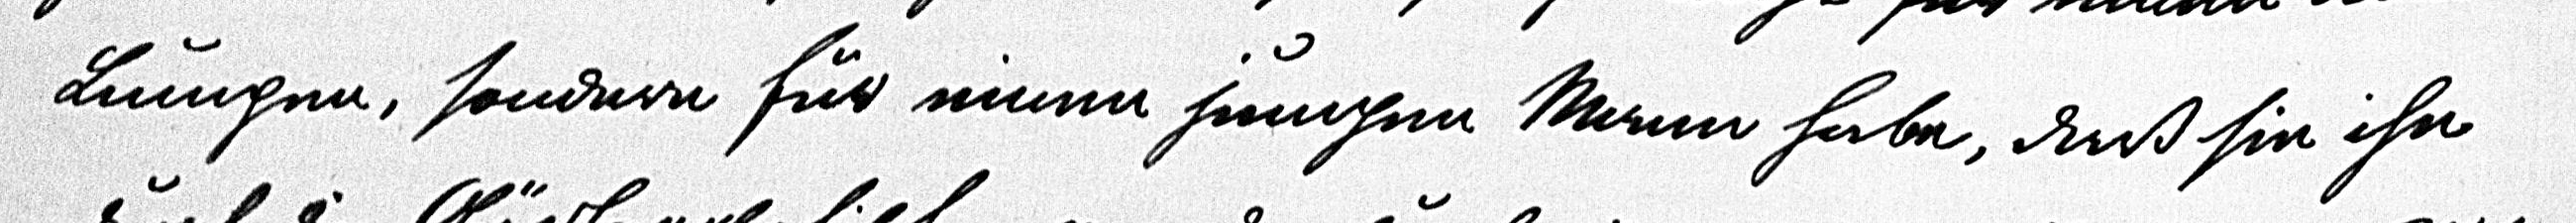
Lumpen, sondern für einem jungen Mann habe, daß sie ihn
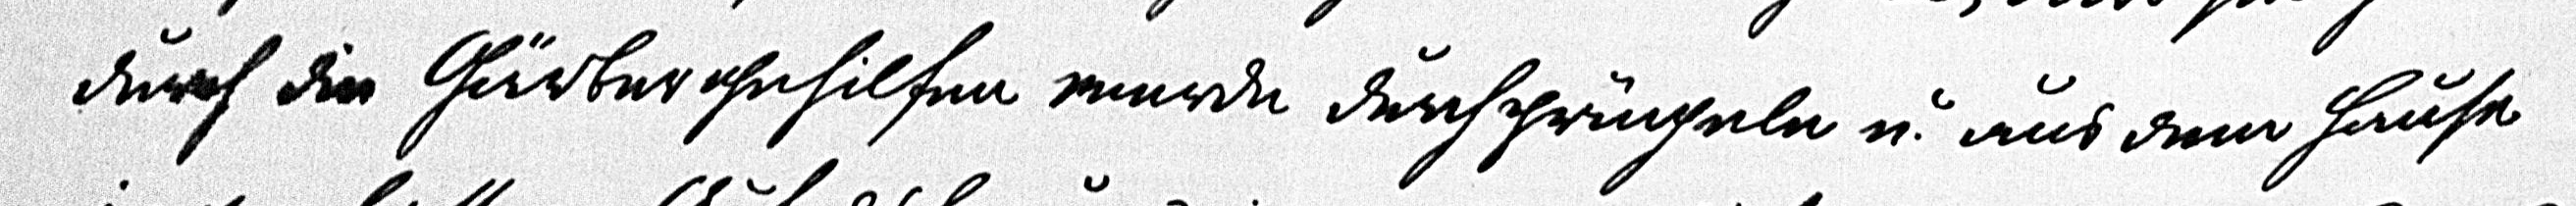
durch die Gärbergehilfen wurde durchprügele u. aus dem Hause
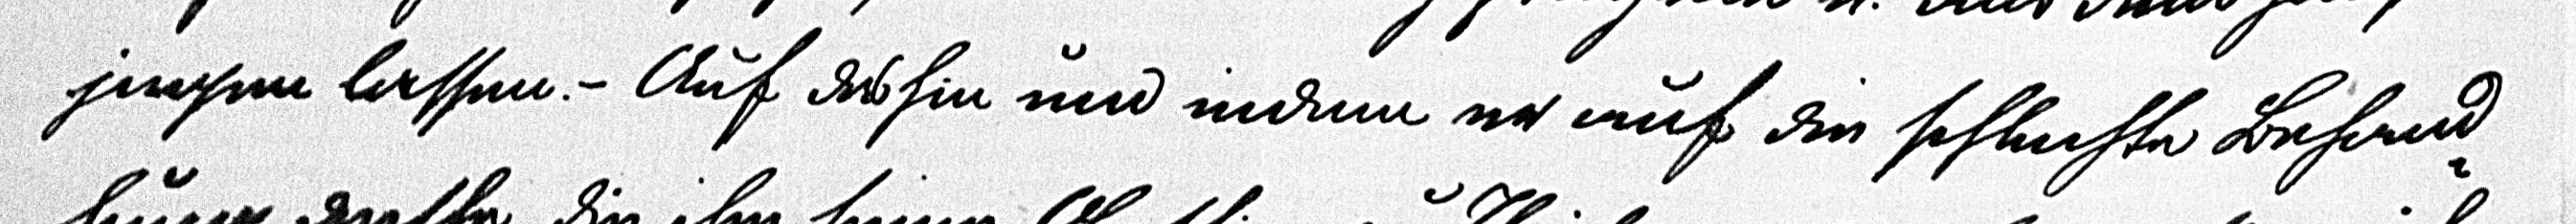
jagen lassen. - Auf das sie und indem er auf die schlachte Behand¬
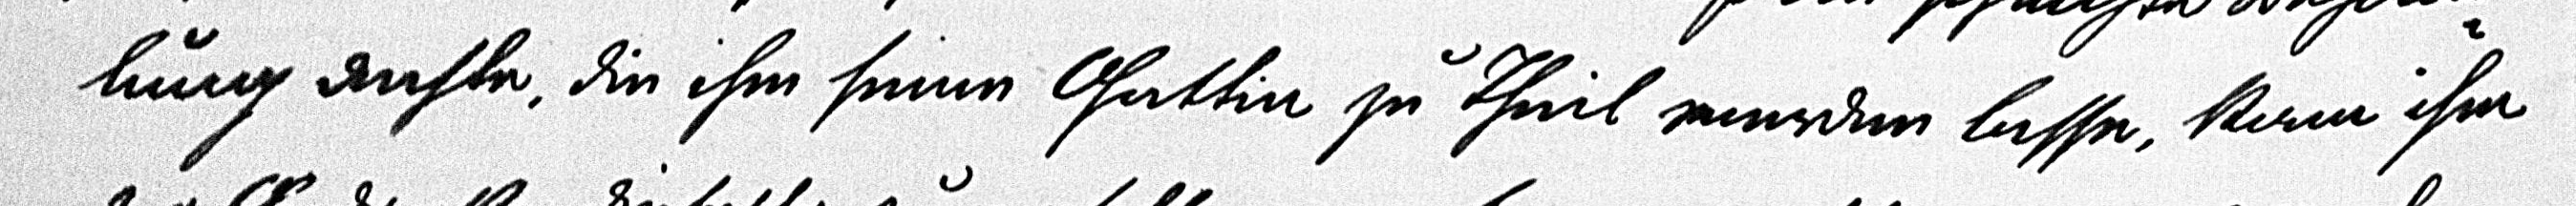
lung deste, die ihm seine Gattin zu Theil werden lasse, kam ihm
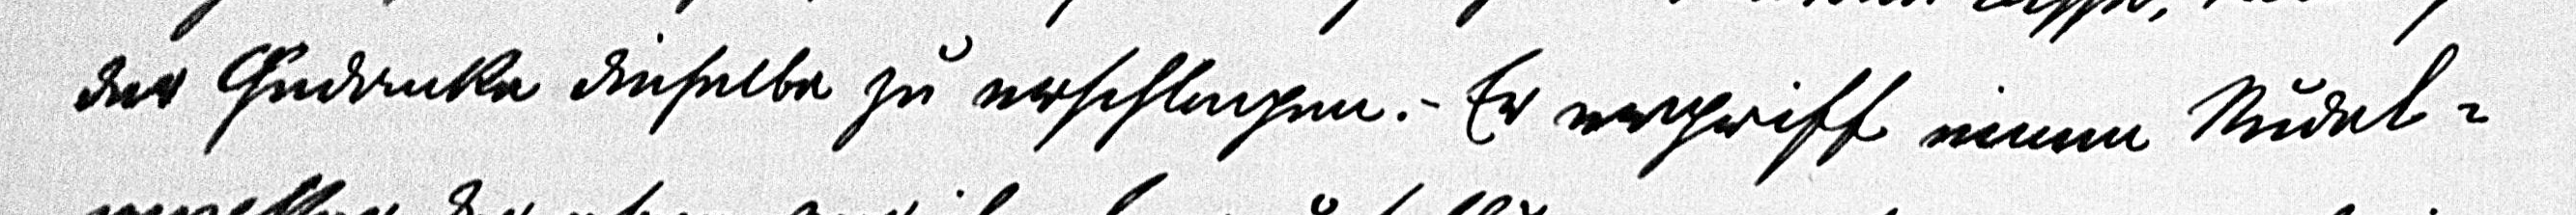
der Gedreke dieselbe zu erschlagen. - Er ergriff einen Nudel¬
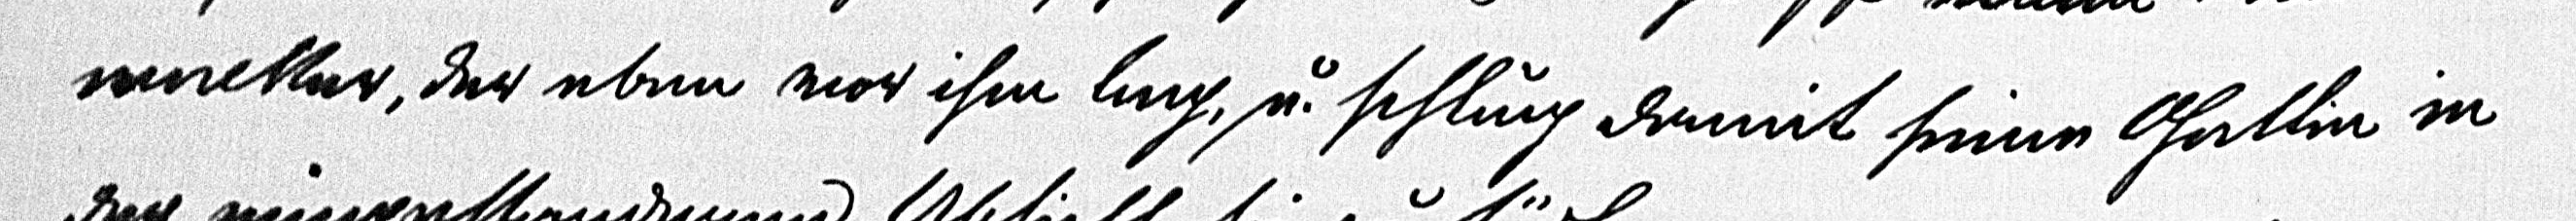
wecker, der eben vor ihm lag, u. schlug damit seine Gattin in
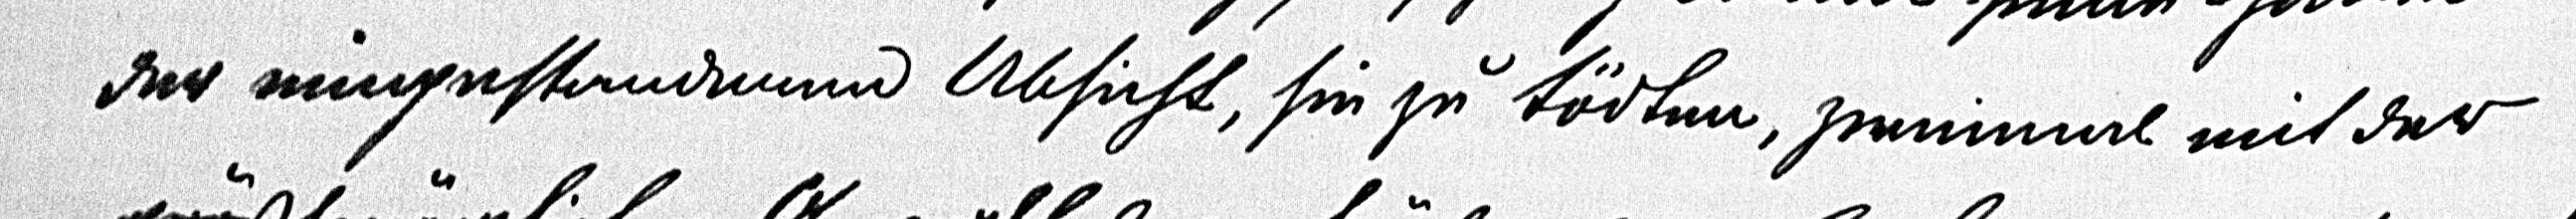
der eingestandnem Absicht, sie zu tödten, zweimal mit der
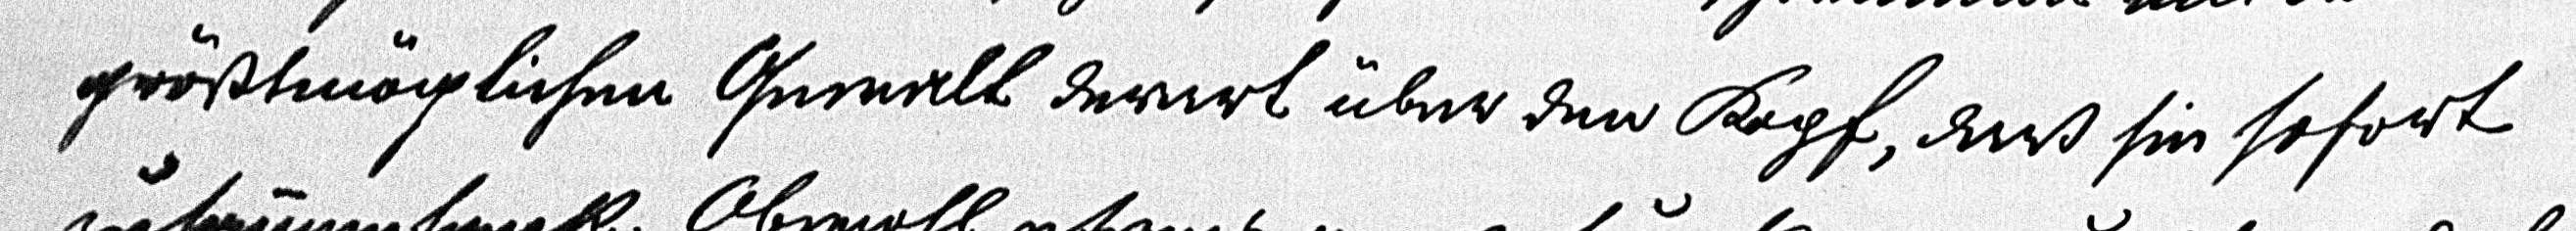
größtmöglichen Gemalt derart über den Kopf, daß sie sofort
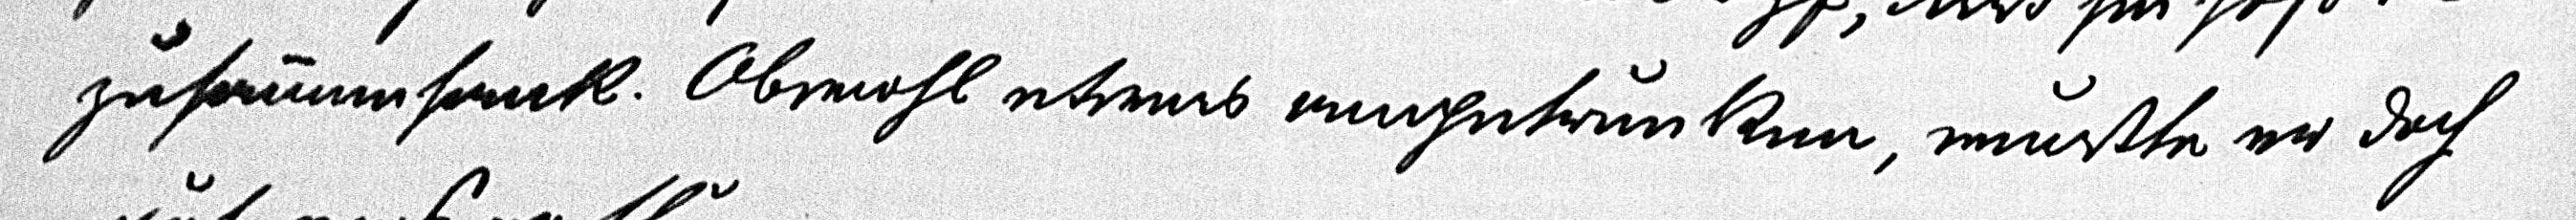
zusammensank. Obwohl etwas angetrunken, neuste er doch
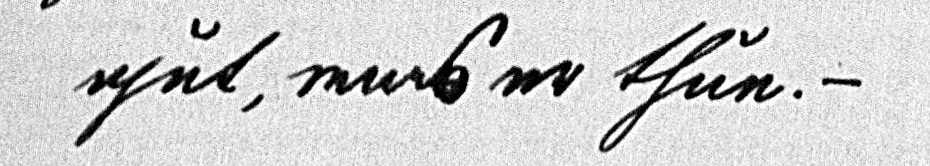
gut, mars er thun. -
